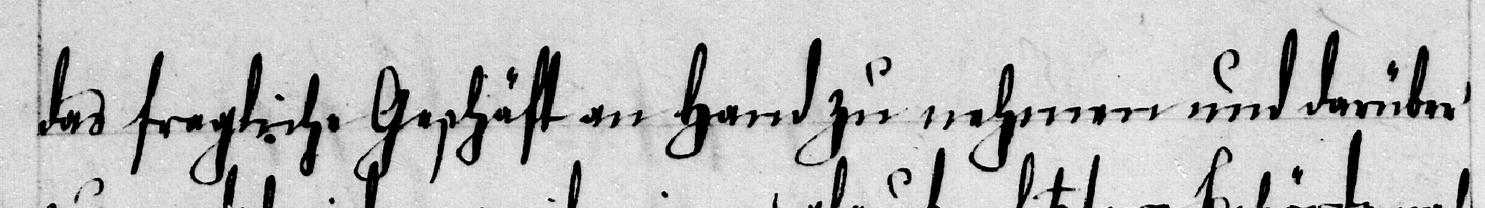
das fragliche Geschäft an Hand zu nehmen und darüber
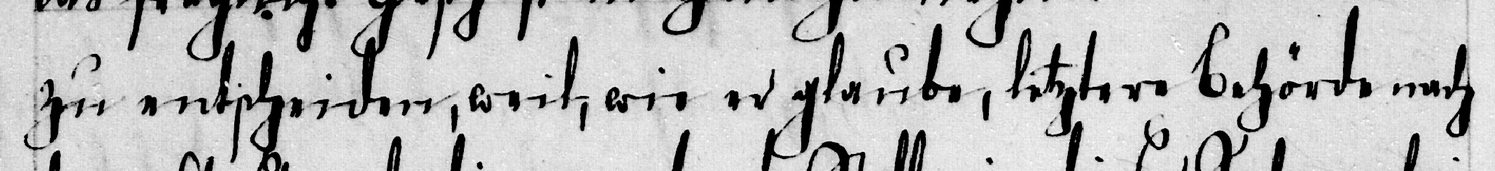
zu entscheiden, weil, wie er glaube, letztere Behörde nach
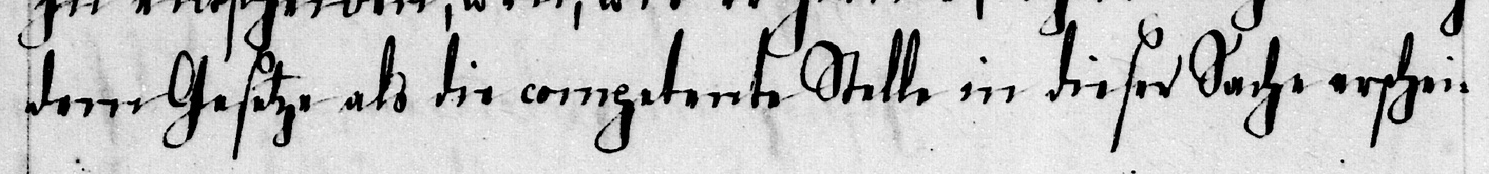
dem Gesetze als die competente Stelle in dieser Sache erschei¬
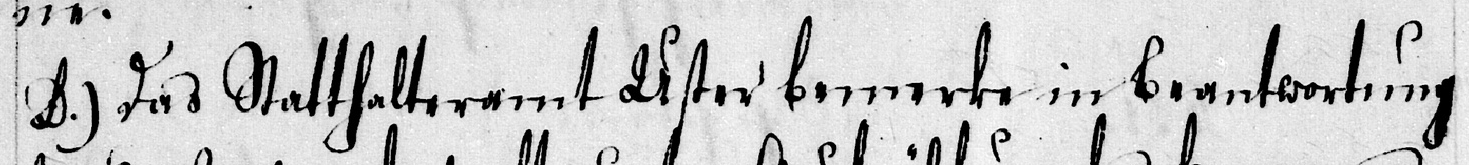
D.) Das Statthalteramt Uster bemerke in Beantwortung
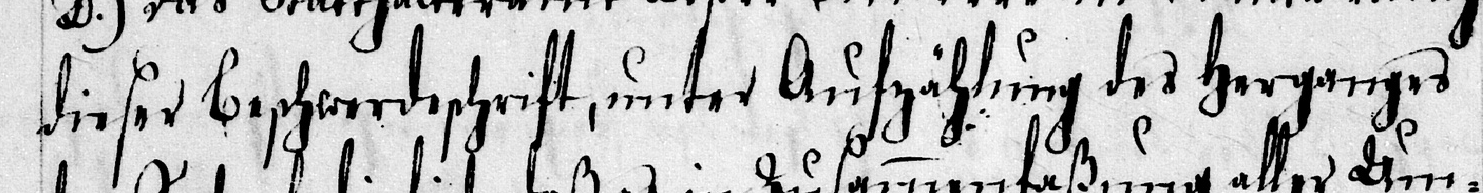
dieser Beschwerdeschrift, unter Aufzählung des Herganges
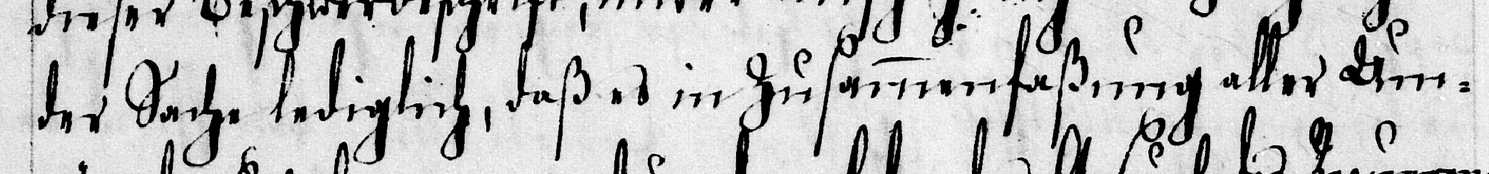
der Sache lediglich, daß es in Zusammenfaßung aller Um¬
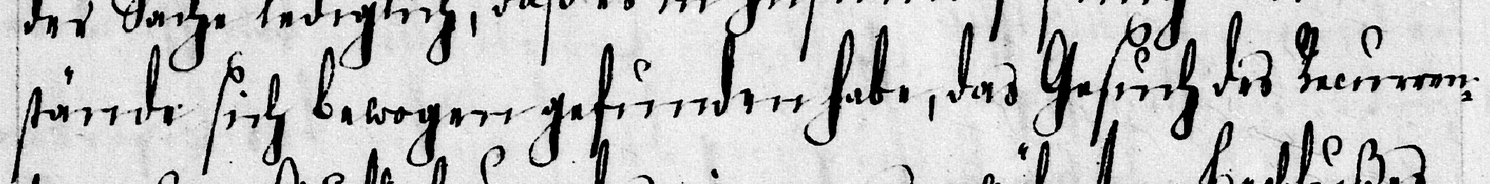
stände sich bewogen gefunden habe, das Gesuch des Recurre¬
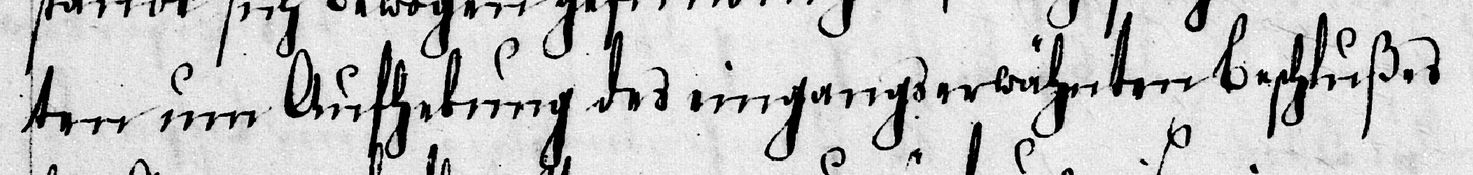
nten um Aufhebung des eingangserwähnten Beschlußes
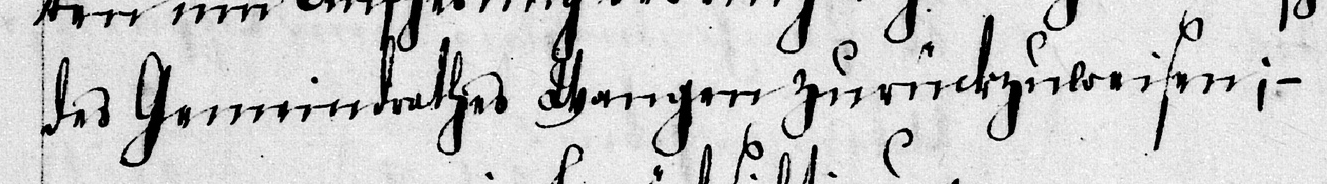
des Gemeindrathes Wangen zurückzuweisen; –
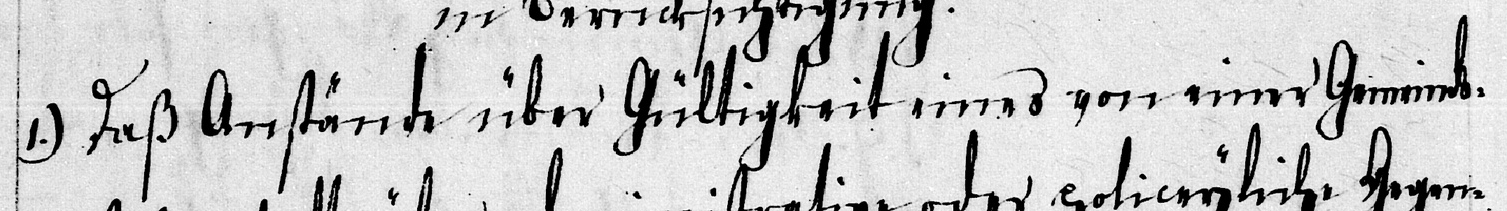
1.) Daß Anstände über Gültigkeit eines von einer Gemeinds¬
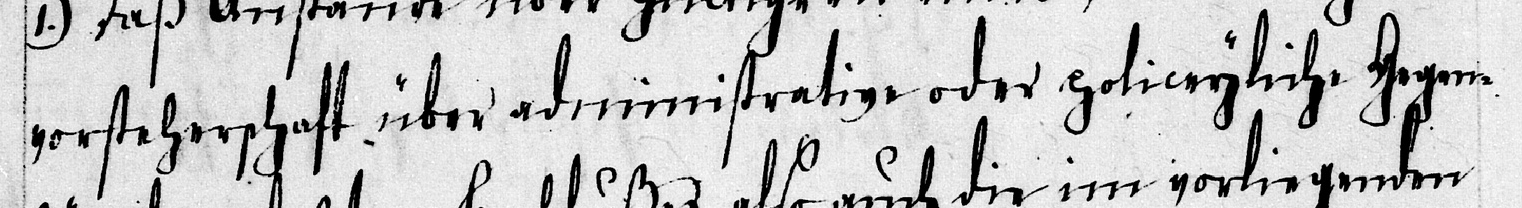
vorsteherschaft über administrative oder policeyliche Gegen¬
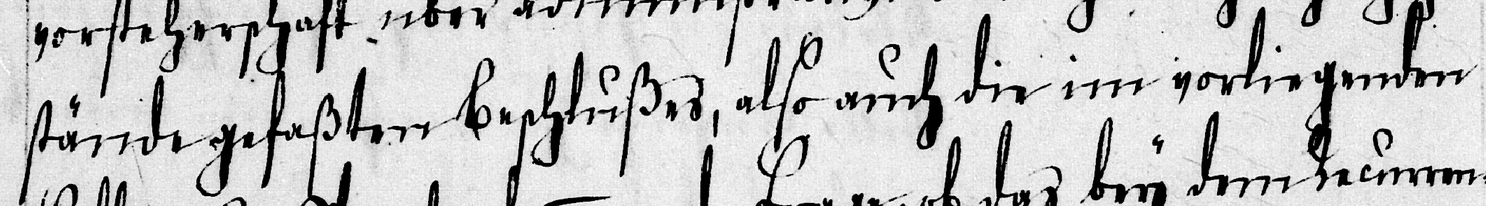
stände gefaßten Beschlußes, also auch die im vorliegenden
